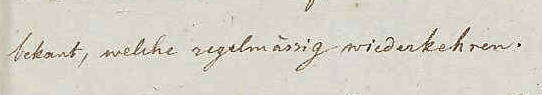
bekant, welche regelmässig wiederkehren.
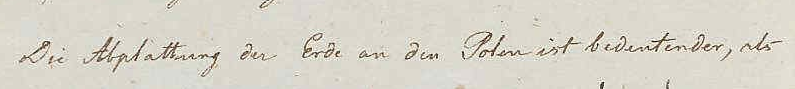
Die Abplattung der Erde an den Polen ist bedeutender, als
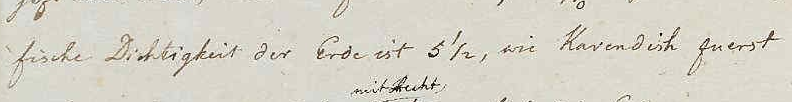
fische Dichtigkeit der Erde ist 5½, wie Kavendish zuerst
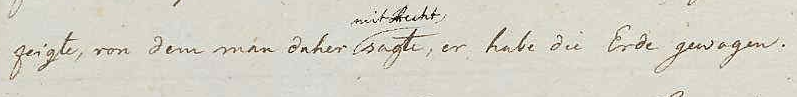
zeigte, von dem man daher mit Recht sagte, er habe die Erde gewogen.
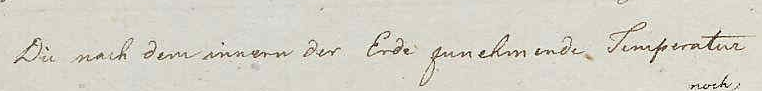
Die nach dem innern der Erde zunehmende Temperatur
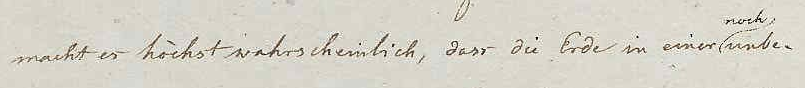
macht es höchst wahrscheinlich, dass die Erde in einer noch unbe-
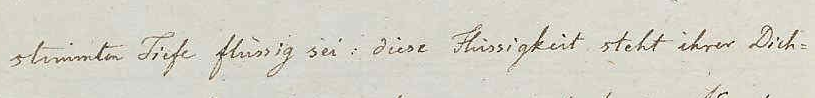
stimmten Tiefe flüssig sei: diese Flüssigkeit steht ihrer Dich-
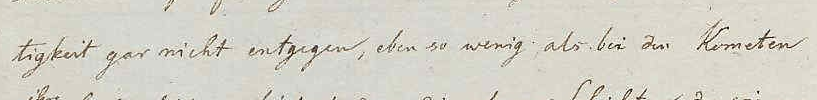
tigkeit gar nicht entgegen, eben so wenig als bei den Kometen
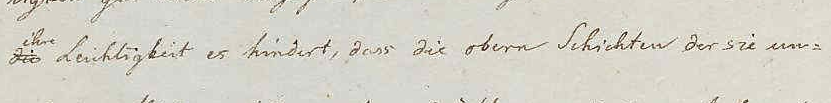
dieihre Leichtigkeit es hindert, dass die obern Schichten der sie um-
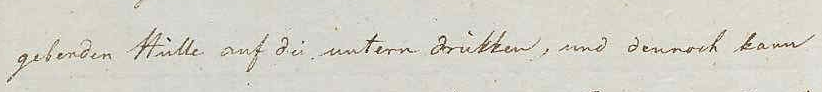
gebenden Hülle auf die untern drükken, und dennoch kann
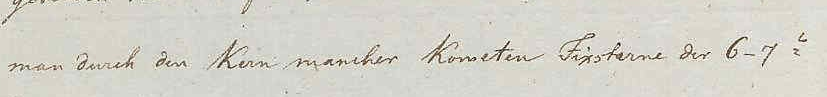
man durch den Kern mancher Kometen Fixsterne der 6–7￼
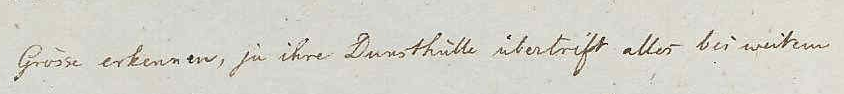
Grösse erkennen, ja ihre Dunsthülle übertrift alles bei weitem
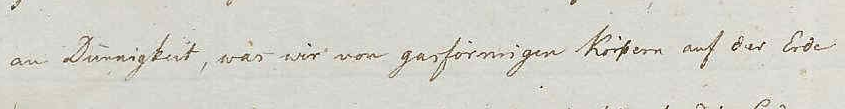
an Dünnigkeit, was wir von gasförmigen Körpern auf der Erde
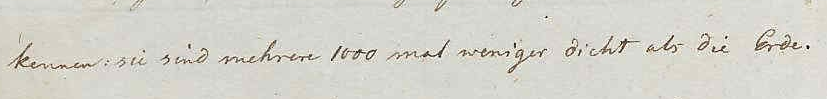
kennen: sie sind mehrere 1000 mal weniger dicht als die Erde.
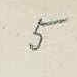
der
